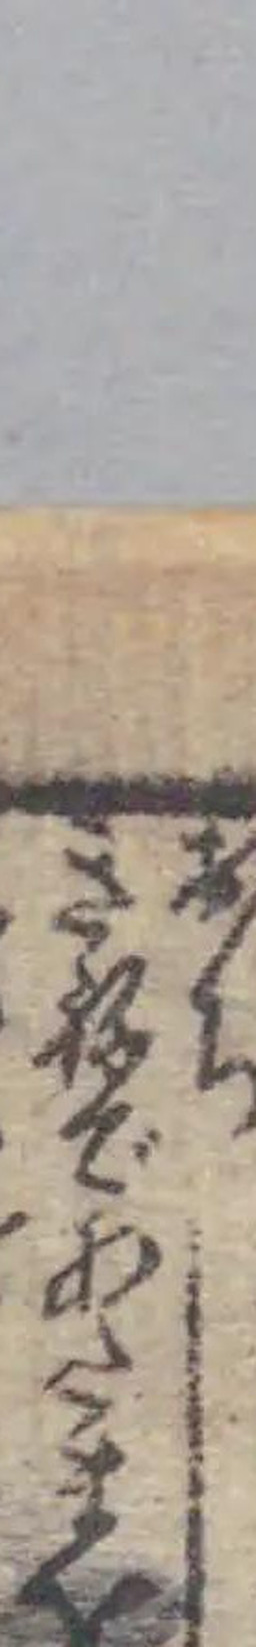きねであたまを
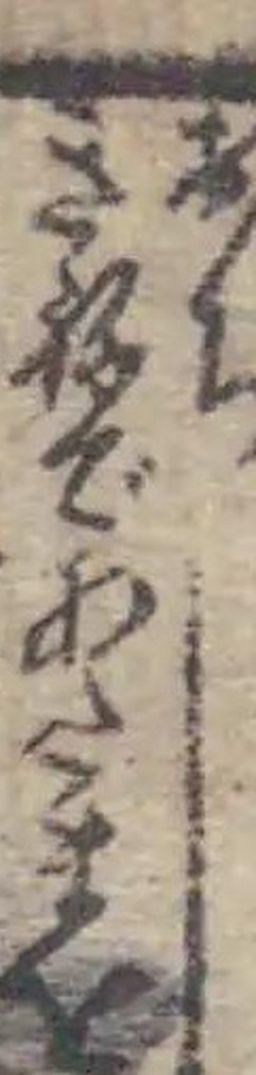きねであたまを
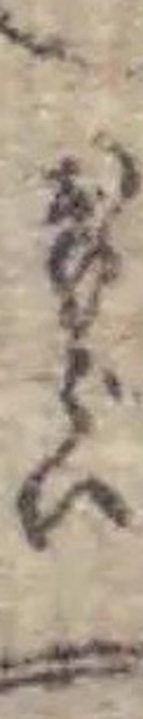おもらい
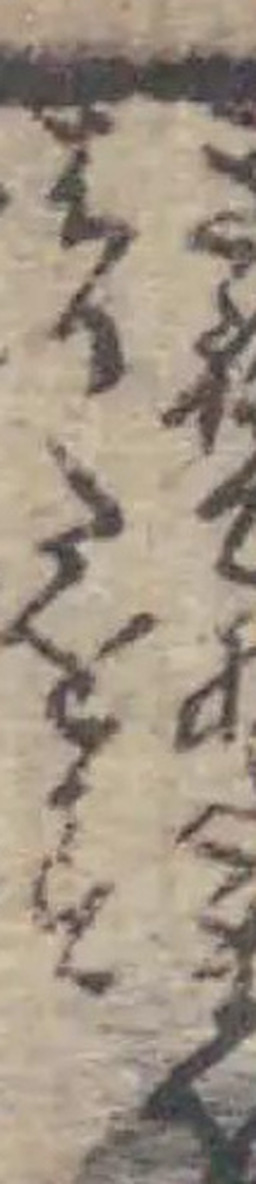はりたをす
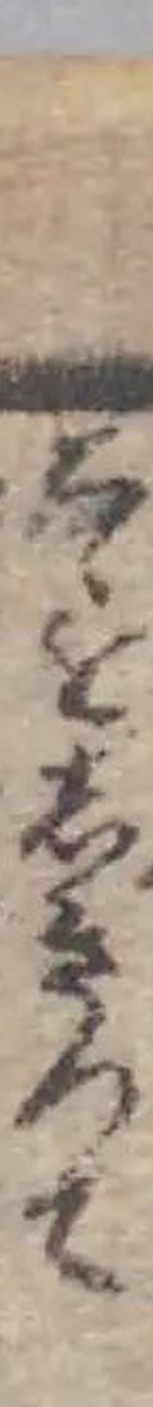こゝをしきつて
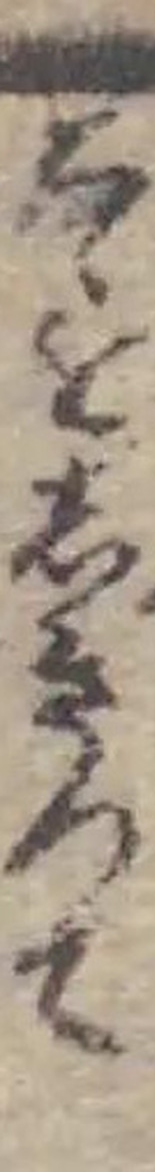こゝをしきつて
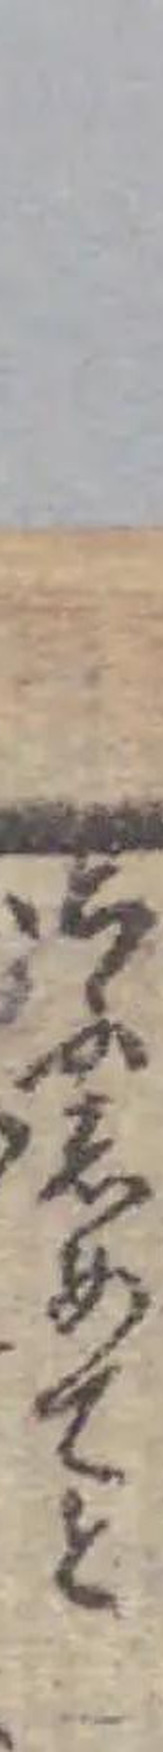こふしめとて
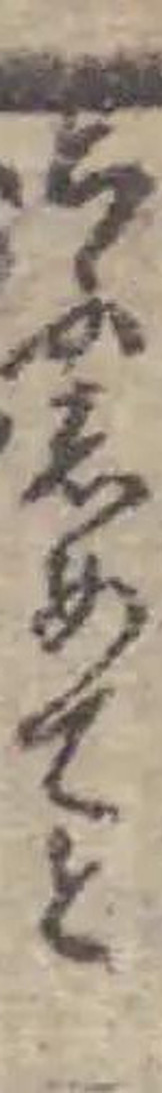こふしめとて
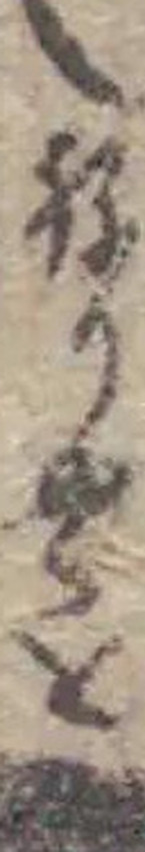ねりやくを
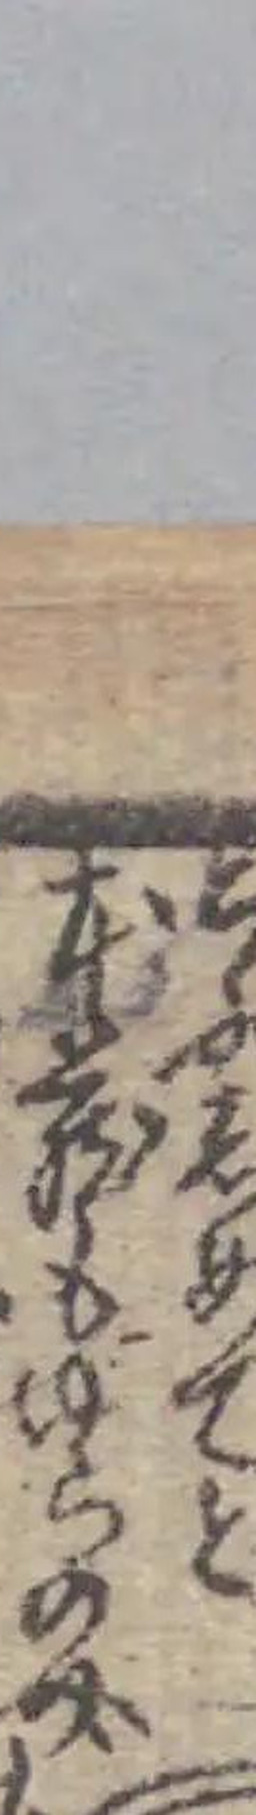本蔵もゆらの介も
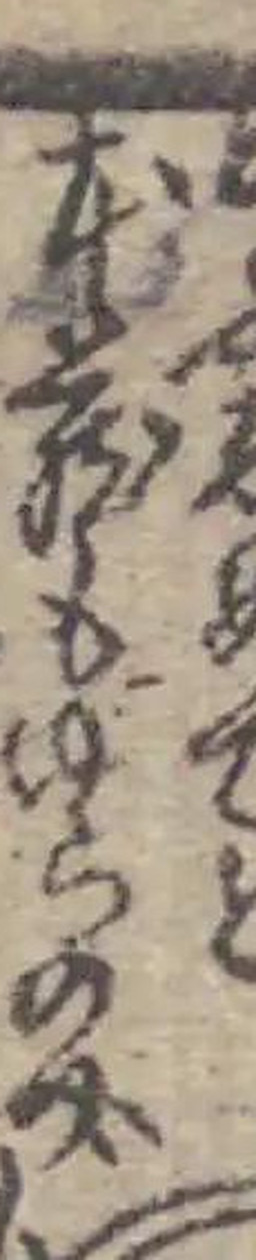本蔵もゆらの介も
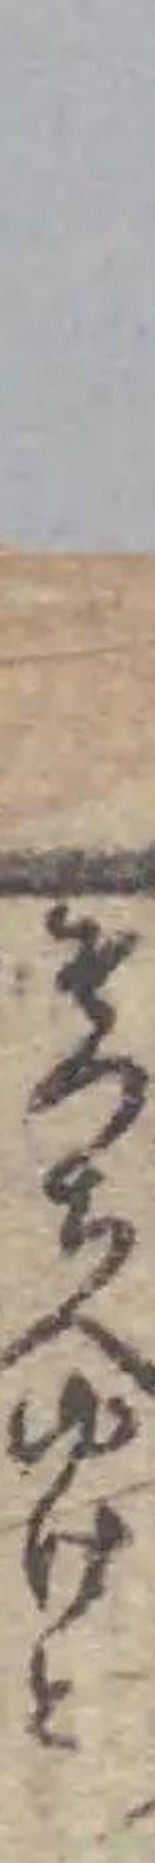そつちへゆけと
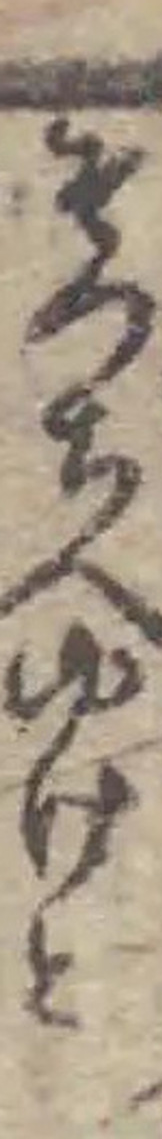そつちへゆけと
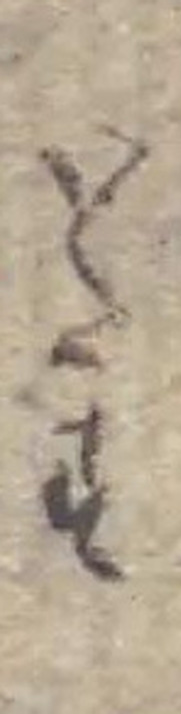いたす
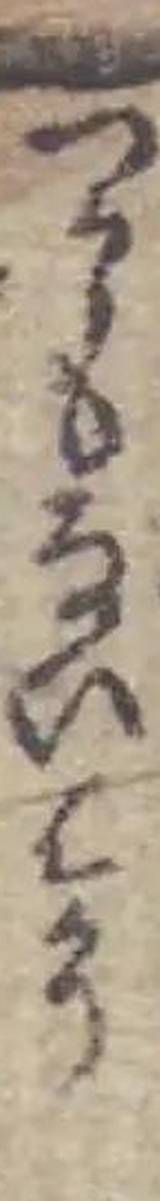つかもないはかり
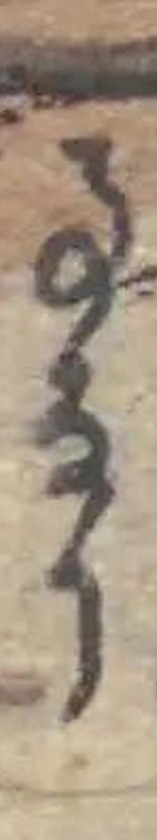事なり
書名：蟹牛房挟多 3巻
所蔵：国立国会図書館 National Diet Library, JAPAN
